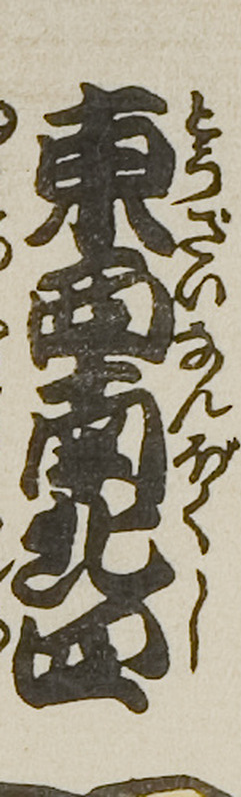東西南北四
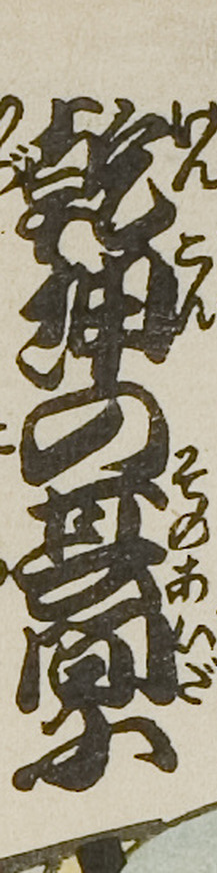乾坤の其間に
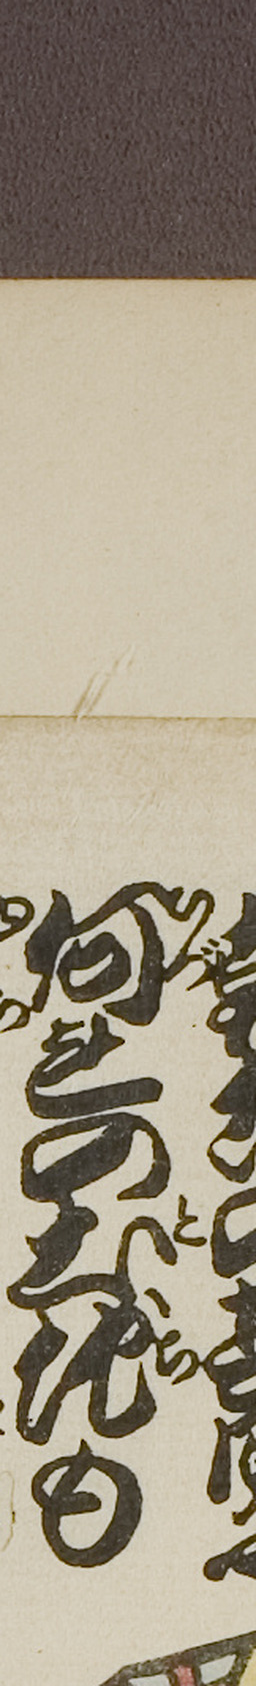何れの土地も
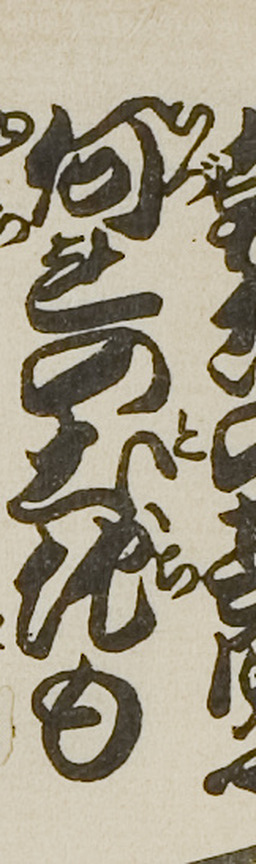何れの土地も
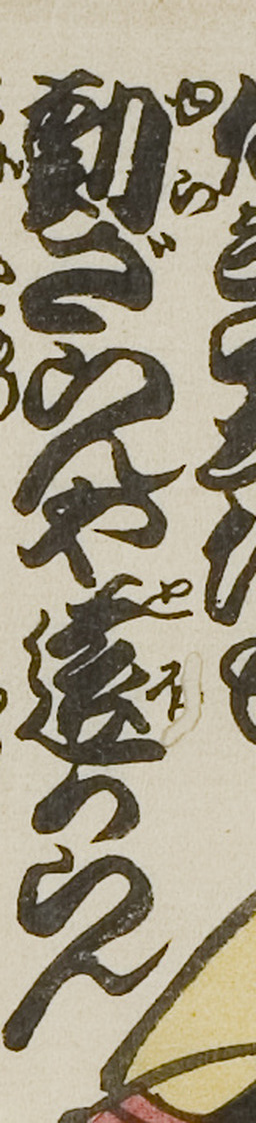動ざらんや遠からん
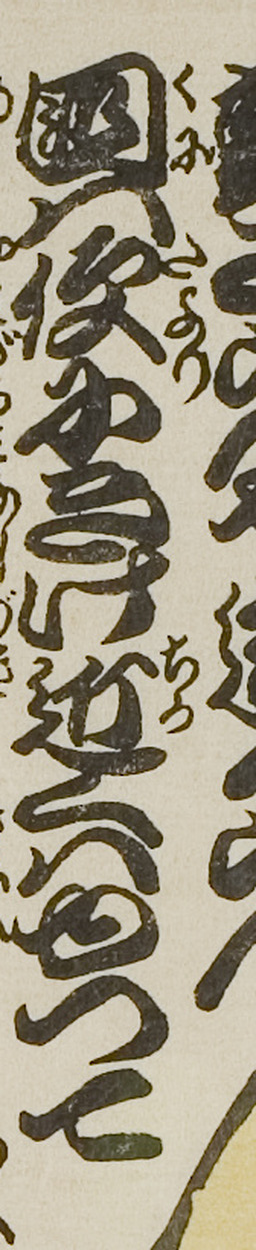国は便にきけ近くはゆつて
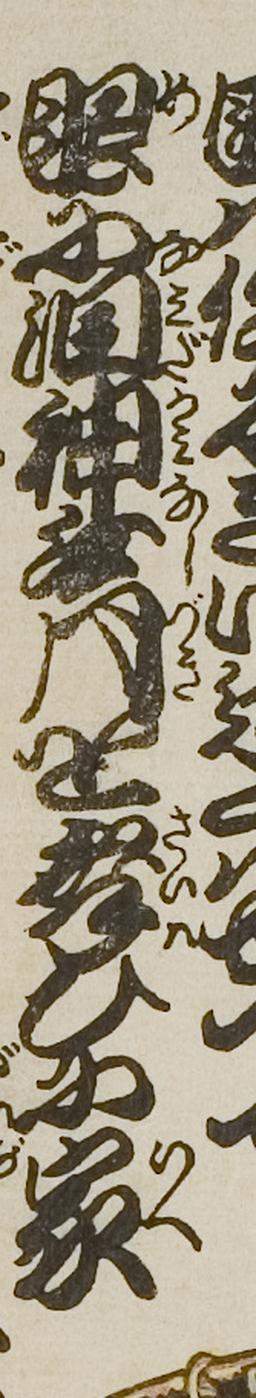眼に泪神無月を幸ひに家
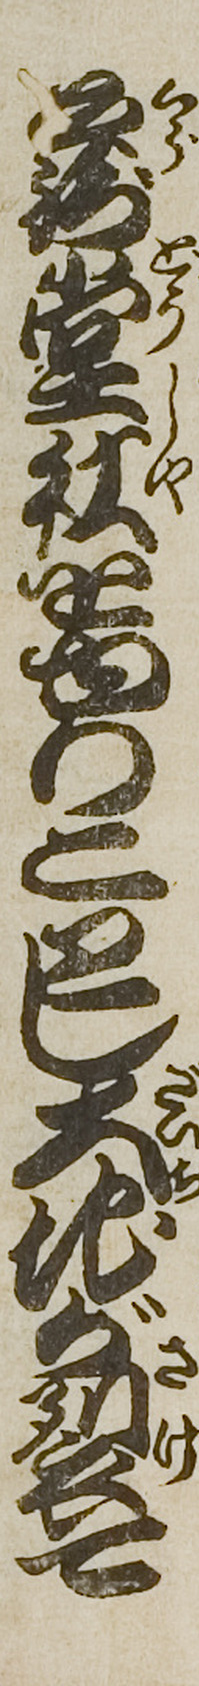蔵堂社をゆりこわし大地が裂て
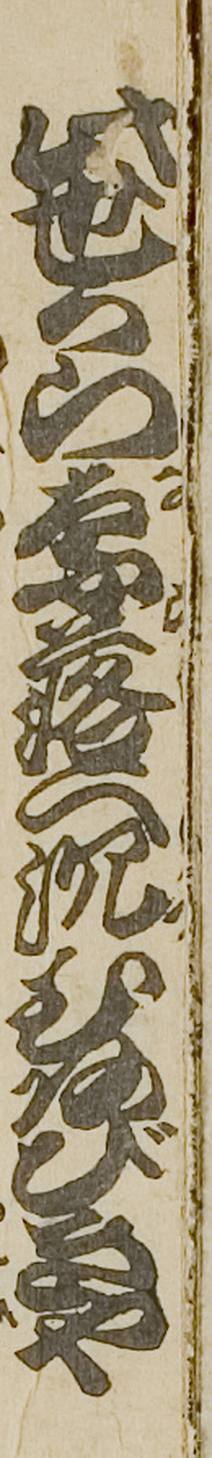此世から奈落へ沈むあびきや
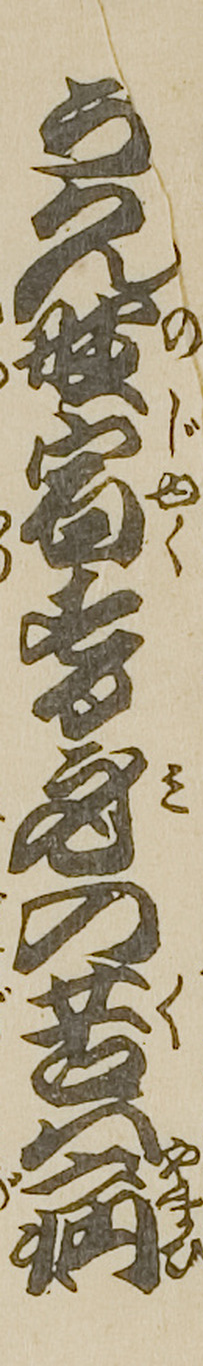うかん野宿する身の苦は病
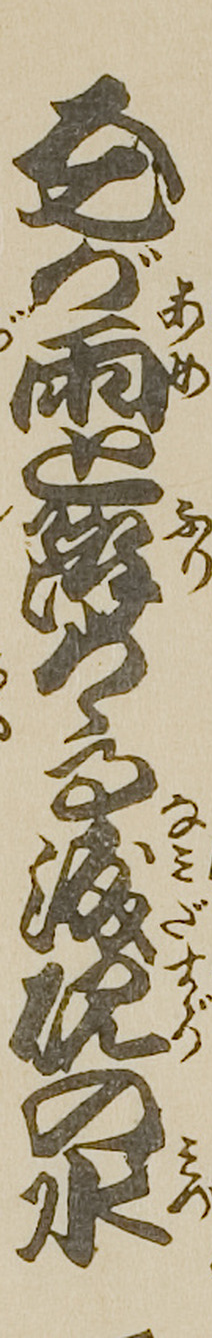五七が雨と降かゝる涙硯の水
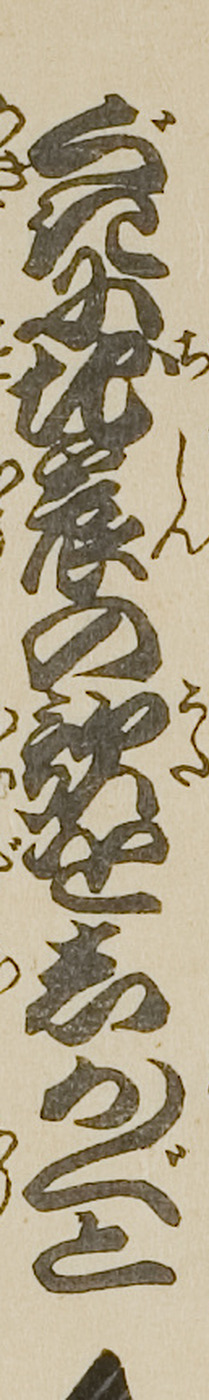ぐきに地震の歌をしか〴〵と
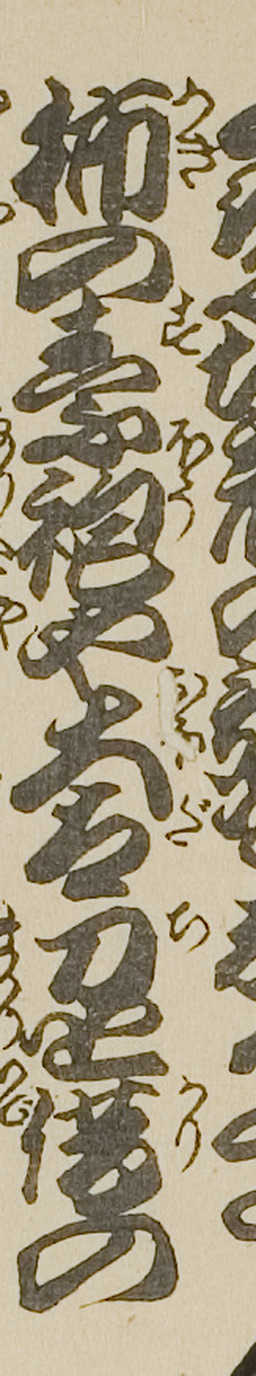柿の素袍や大太刀と借の
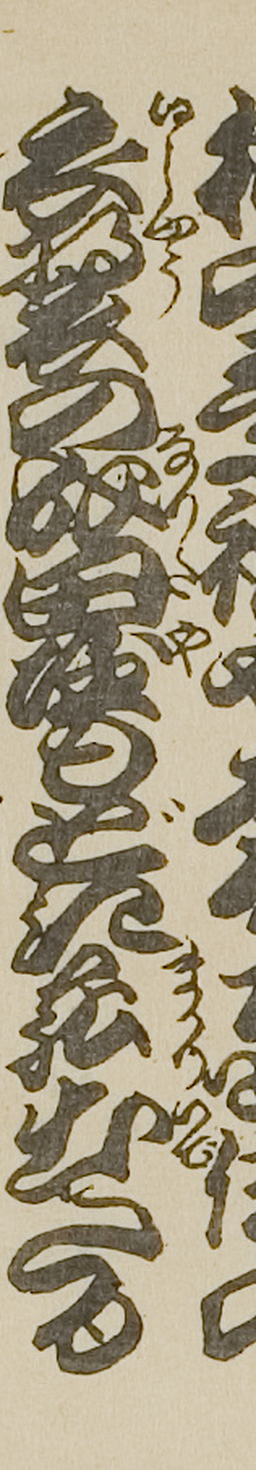衣装の成田屋もどき罷出たる
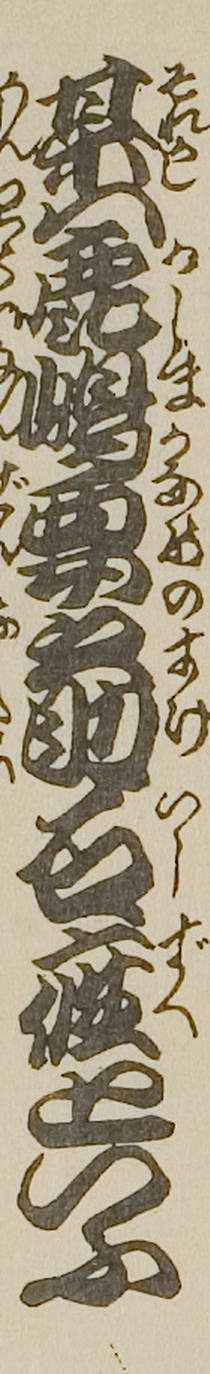某は鹿島要之助石座といふ
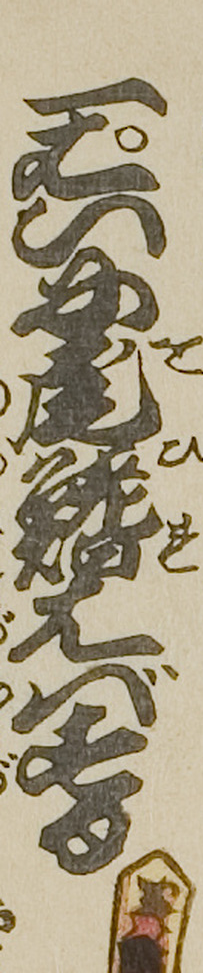一ぱいに尾鰭はばする
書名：聖代要石治万歳楽のつらね
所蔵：東京大学総合図書館 General Library in the University of Tokyo, JAPAN
